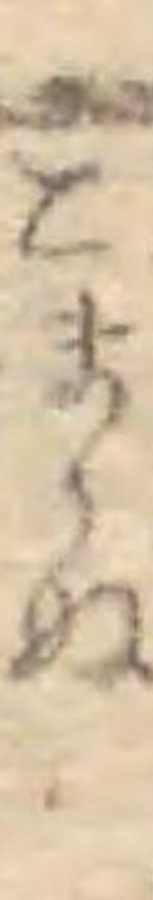こまらぬ
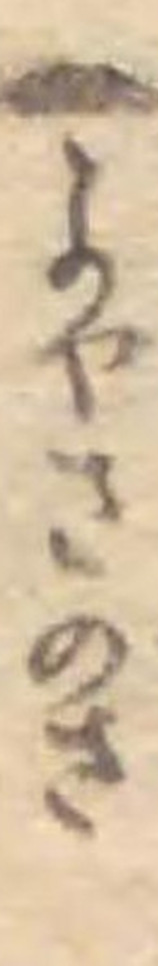よやさのさ
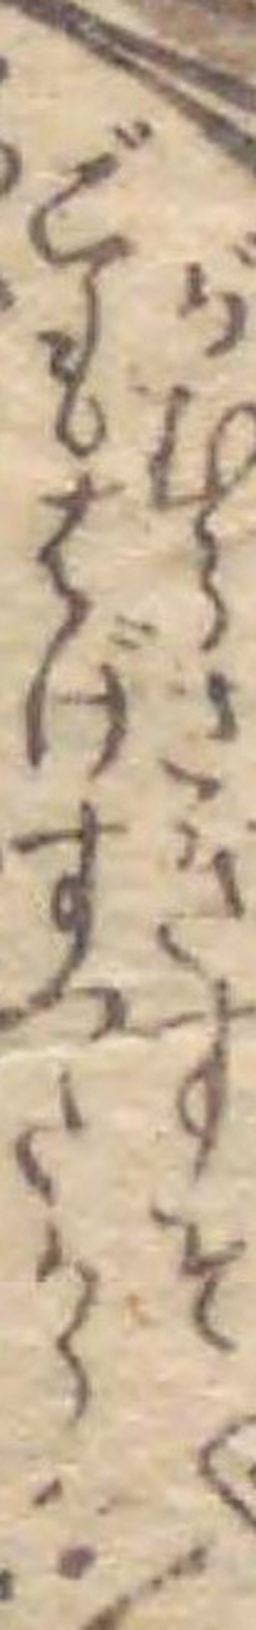ごもはげすつたから
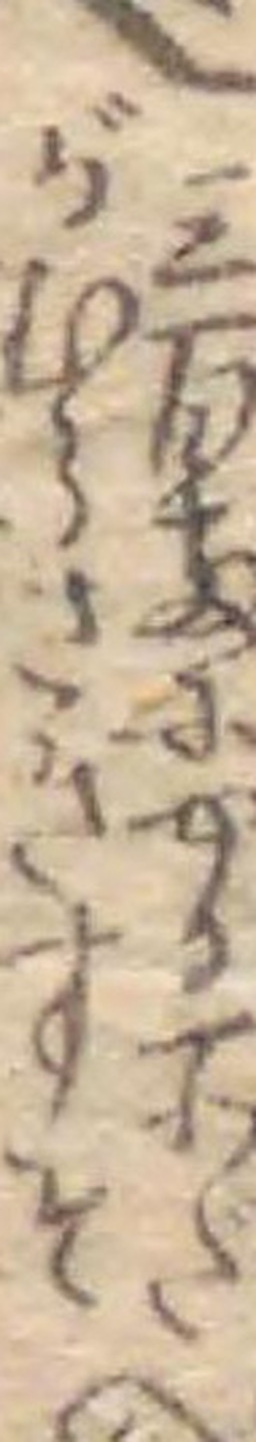がむらさきすそ
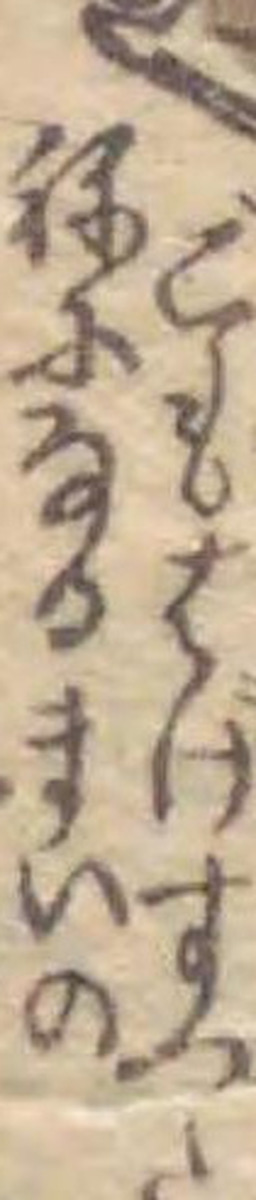ねになるまいの
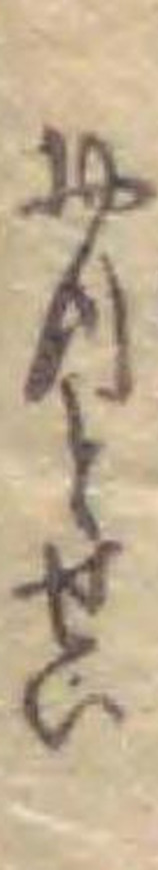おつとせい
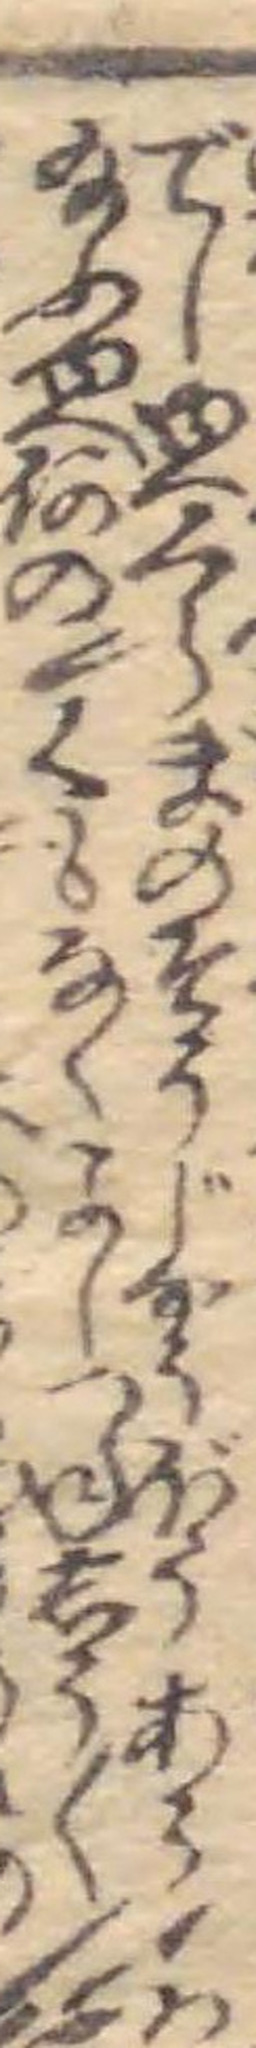給ふゆへ何のくもなくよしつねしう〳〵
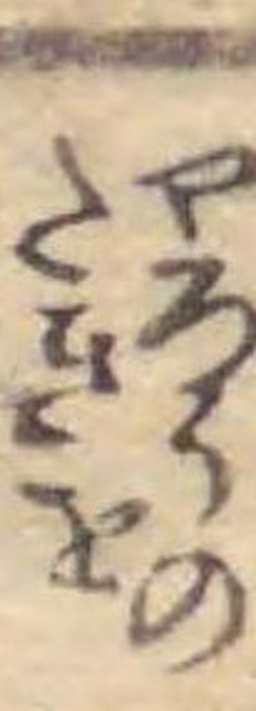たきを
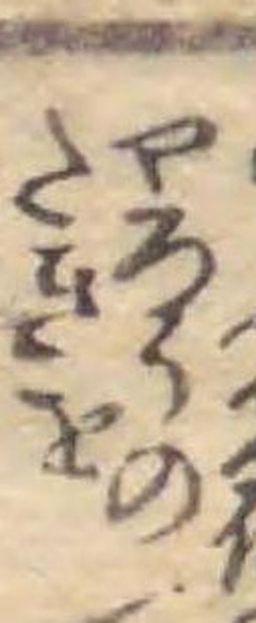たきを
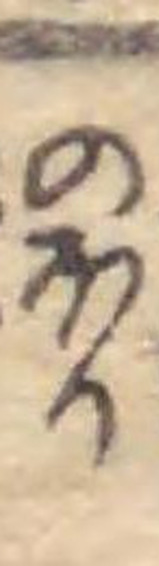のほり
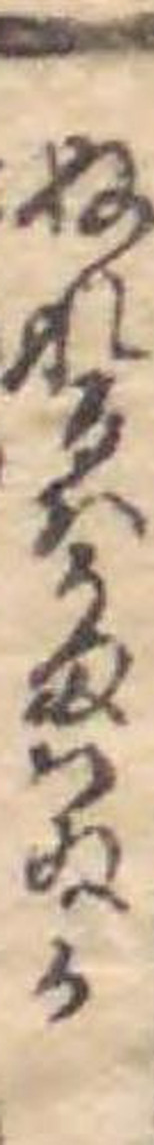ぬれるはかまはぬか
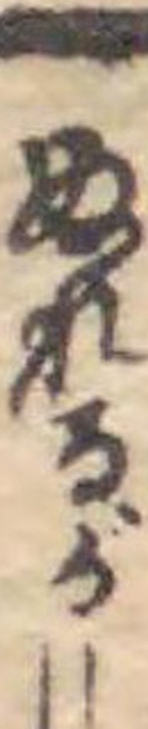ぬれるが
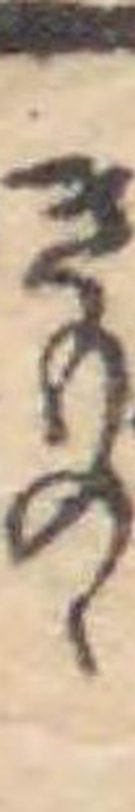きものゝ

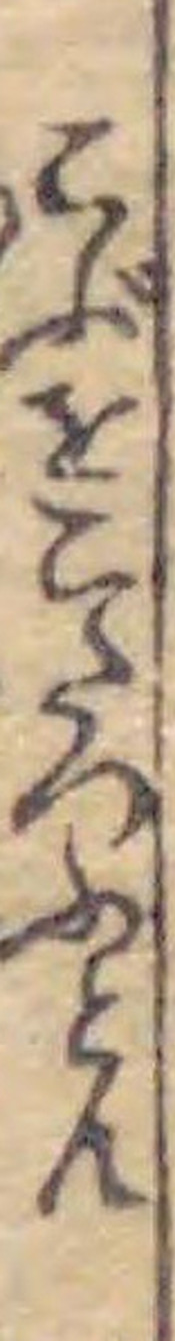こぶをこたつふとん
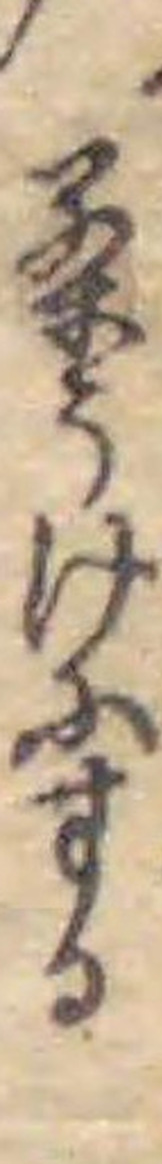茶うけにする
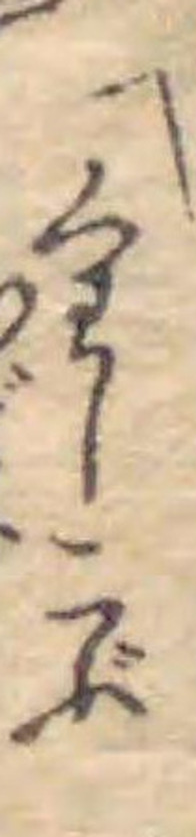〽くわしこぶ
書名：悦贔負蝦夷押領 : 3巻
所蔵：国立国会図書館 National Diet Library, JAPAN
